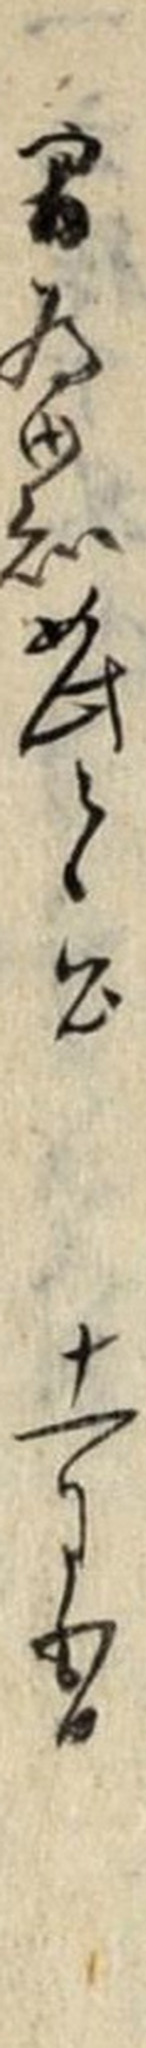間為御知如此候以上十一月五日
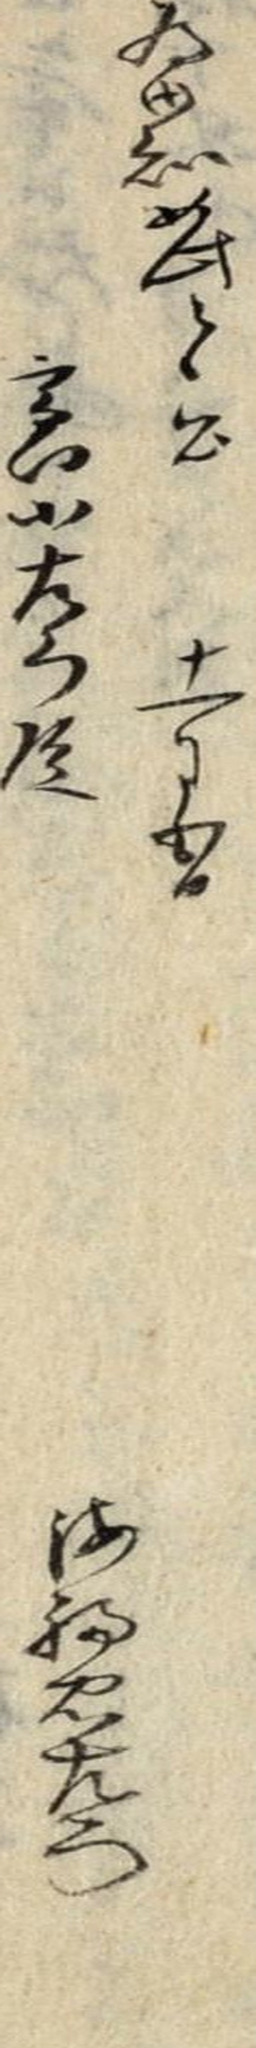高田小左衛門殿海福忠左衛門
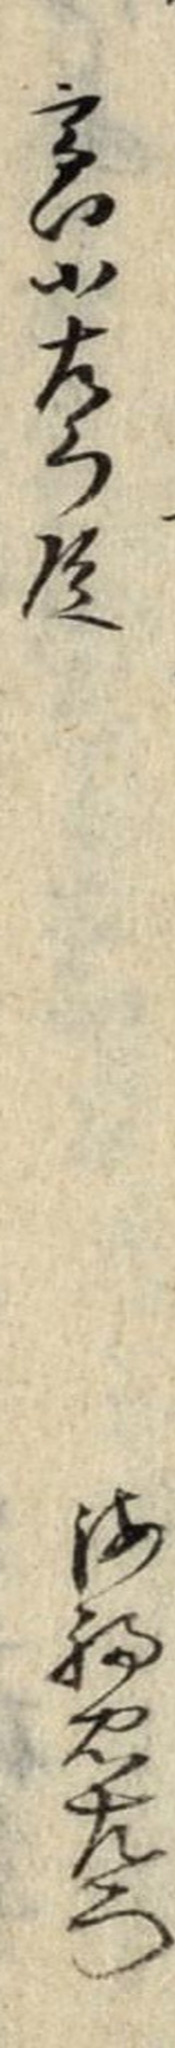高田小左衛門殿海福忠左衛門
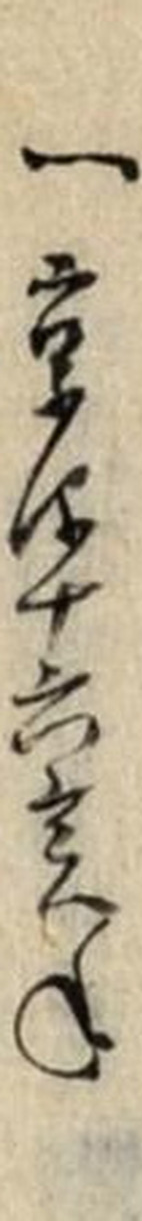一享和十六亥年
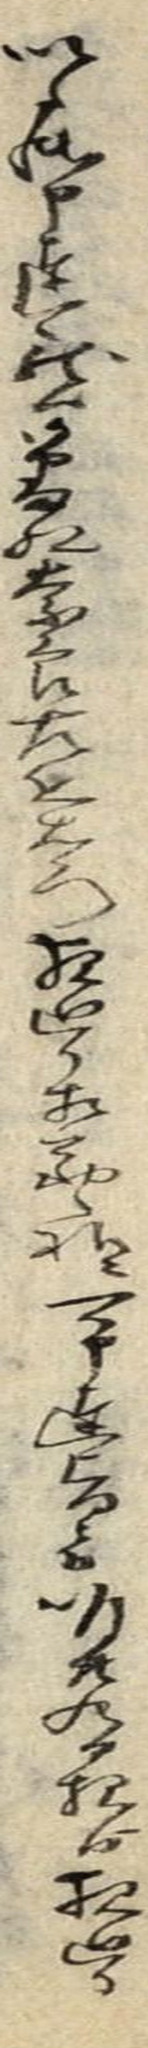以手紙申達候然は御番組奈良左近右衛門夜廻り相勤候様に可申達候旨に付明廿九日夜ゟ夜廻り
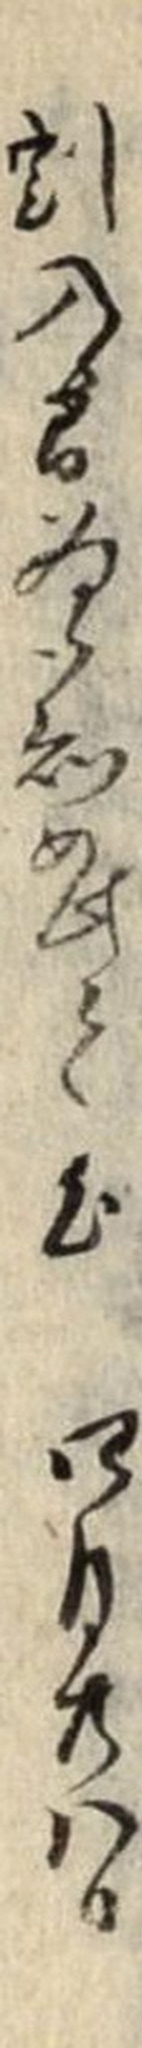割入候間為御知如此に候以上
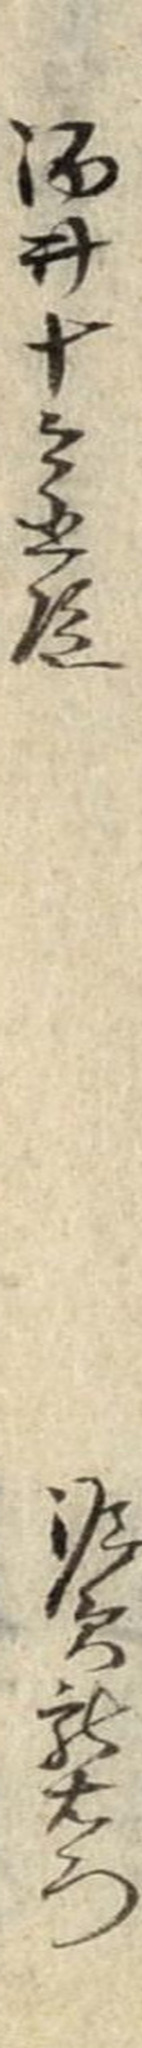酒井十之丞殿渥美新右衛門
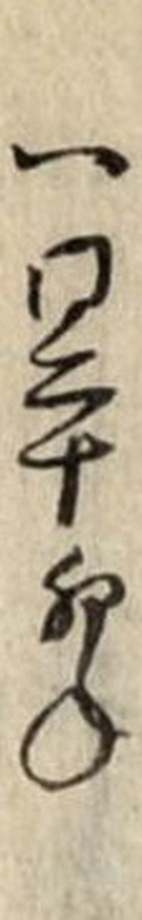一同二十卯年
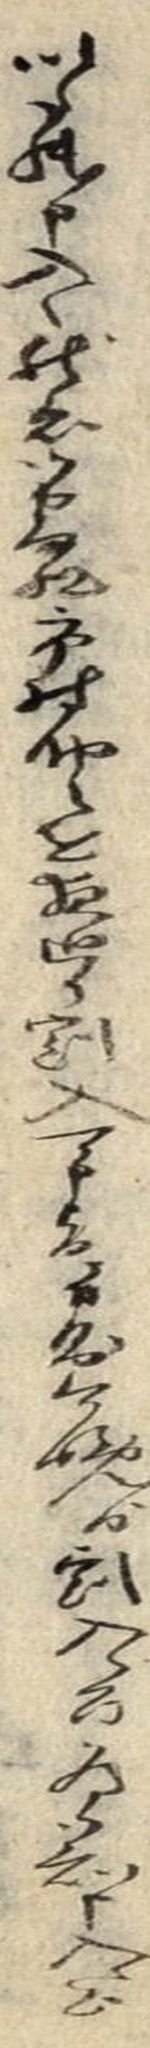以手紙申入候然は御番組市村助之進夜廻り割入可申旨に付則今晩ゟ割入候間為御知申入候以上
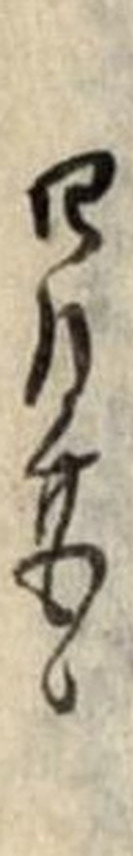四月廿五日
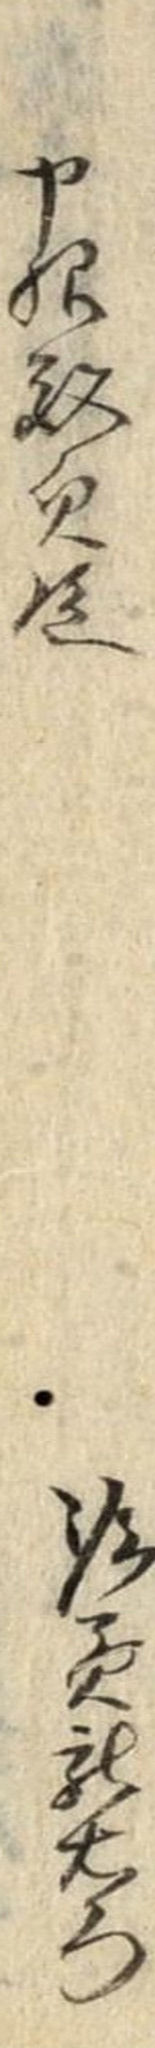中根靭負渥美新右衛門
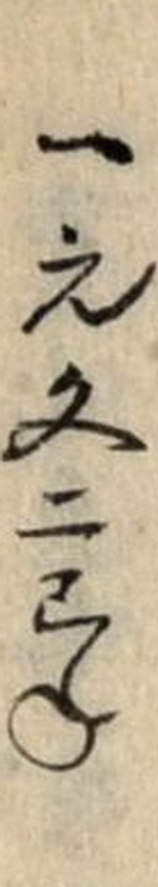一元文二巳年
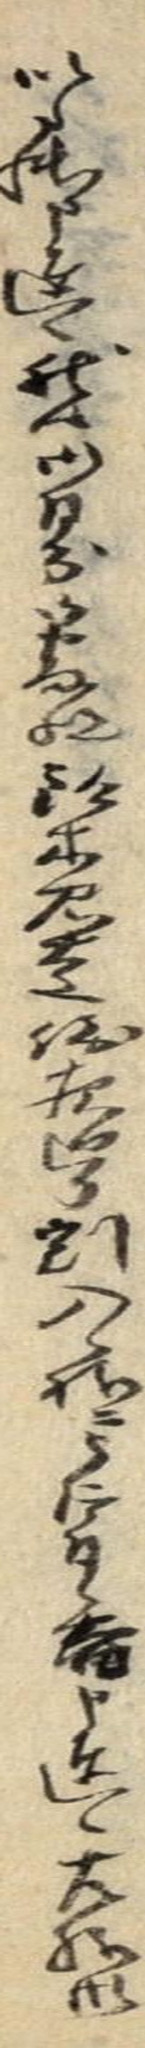以手紙申達候然は御自分御番組鈴木忠太夫儀夜廻り割入候様に被仰付候間申達候左様御

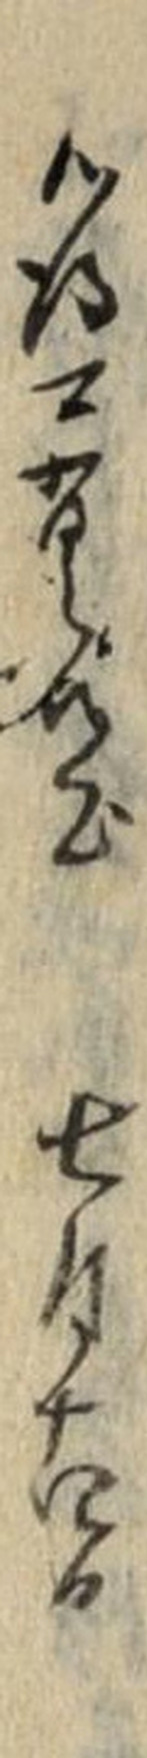心得可有之候以上七月十四日
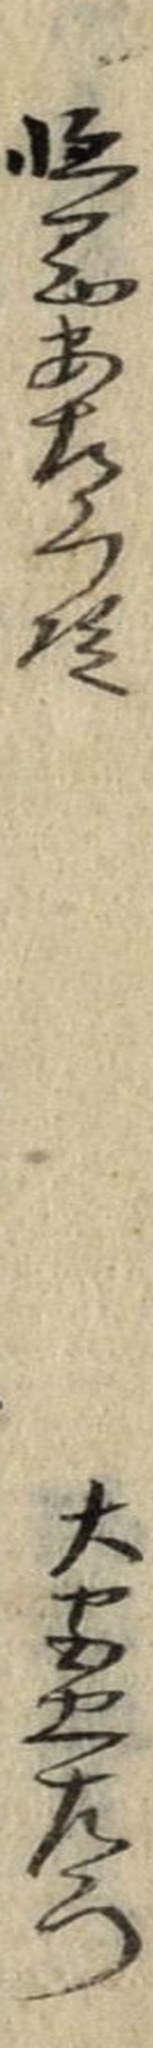恒岡安左衛門殿大宮忠左衛門
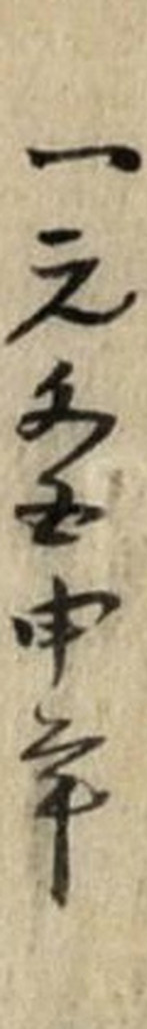一元文五申年
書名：蒐輯之部
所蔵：福井県文書館 Fukui Prefectural Archives
